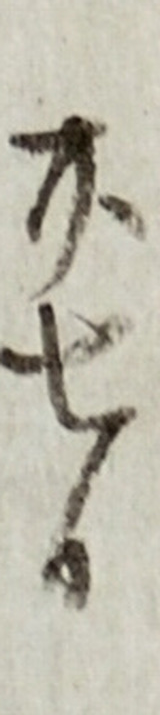廿七日
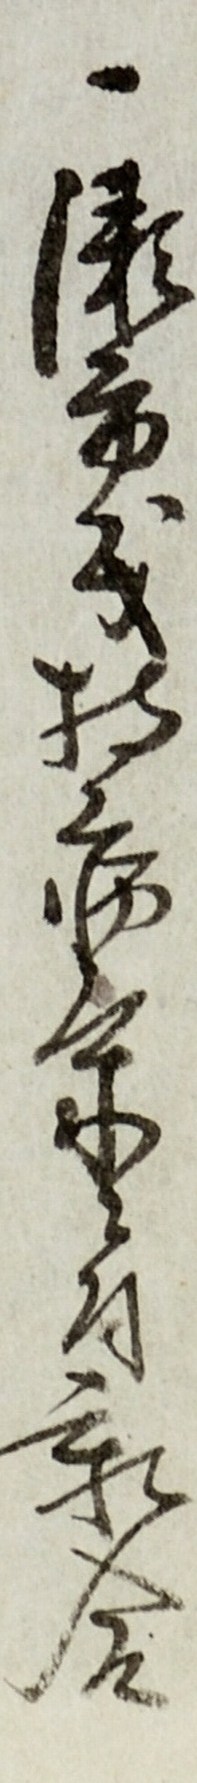一瀬市義持病気ニ付合
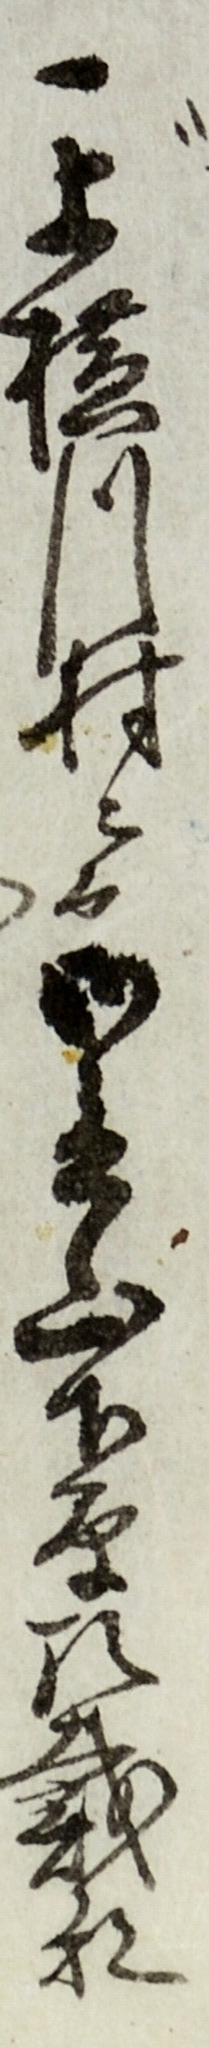一上横川村ニ而御立山下草頂戴願
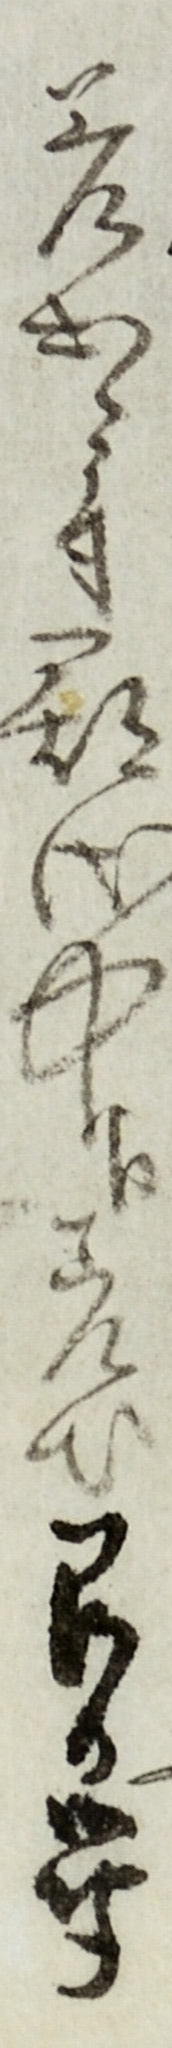差出候ニ付郡代中江差出即日御聞
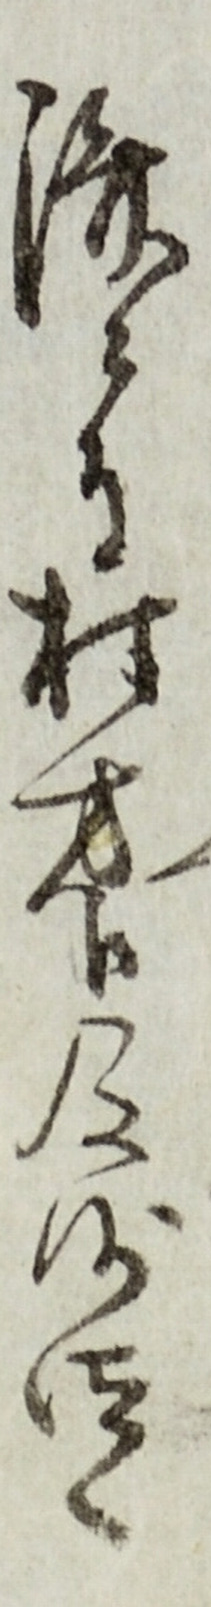済ニ付村方江及沙汰候
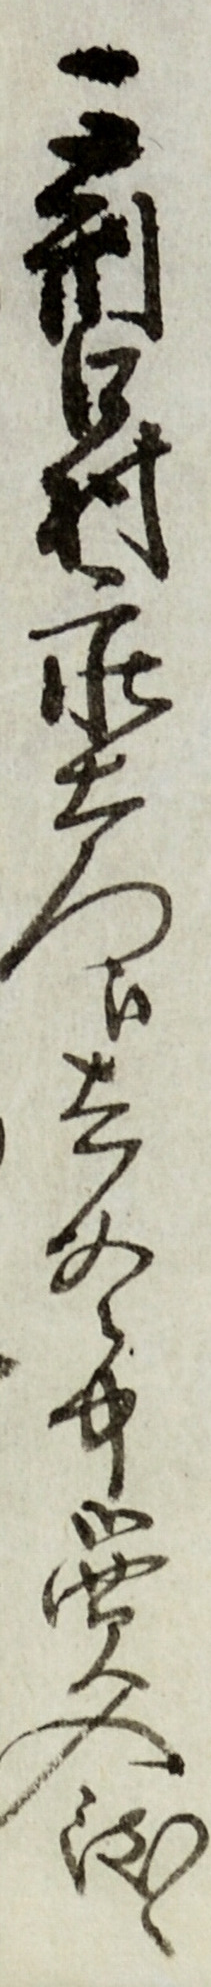一荊口村敬右衛門江去冬中御買入致候
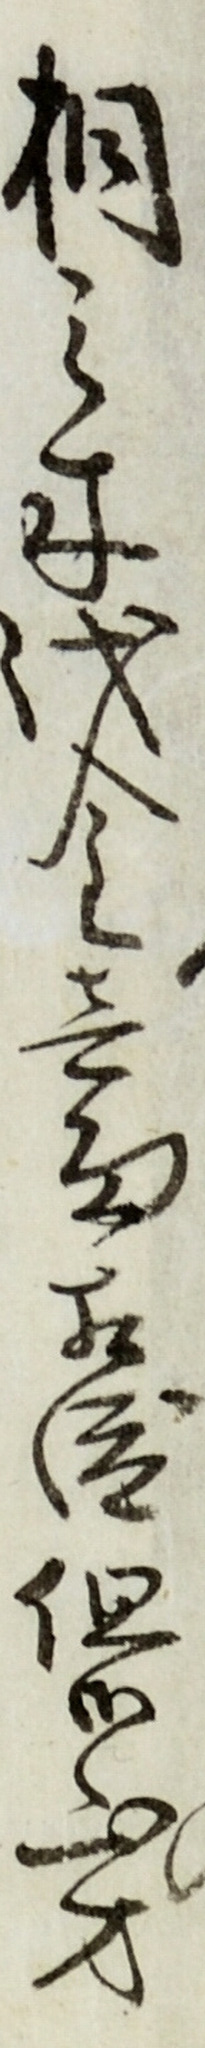桐之木代金壱両相渡但御山方
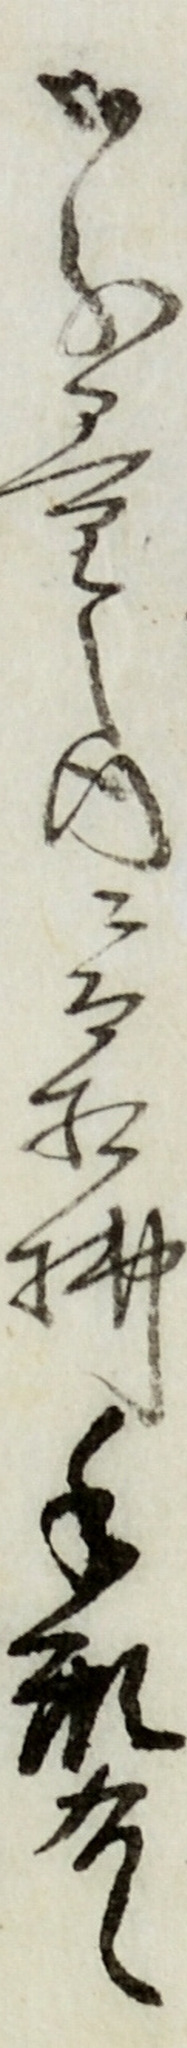御分量之内ニ而相払手形有之
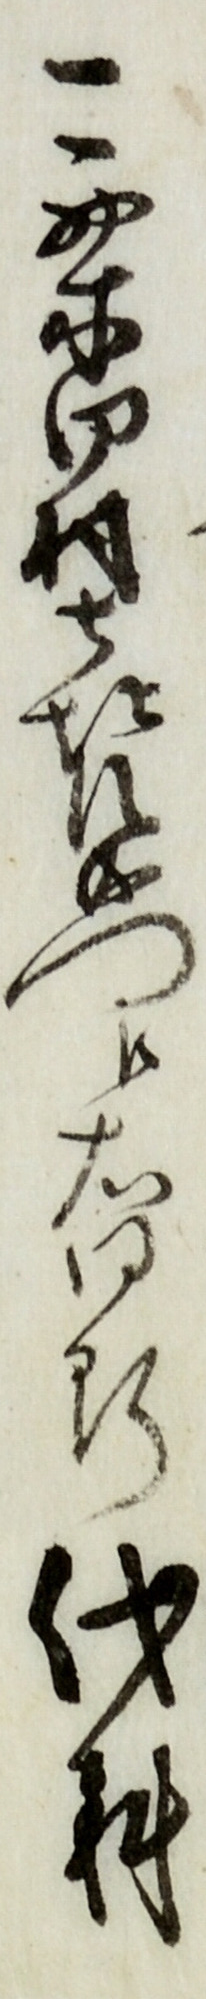一栗田村喜左衛門江右同断代料
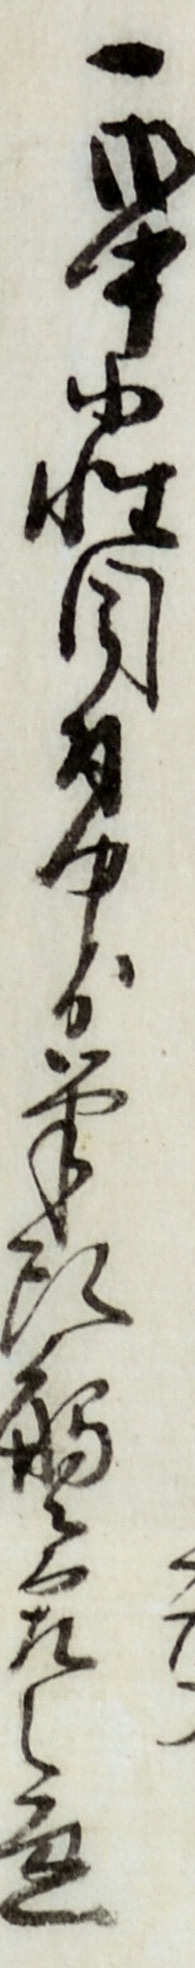一御中小性目付中ゟ筆頭触ニ而左之通

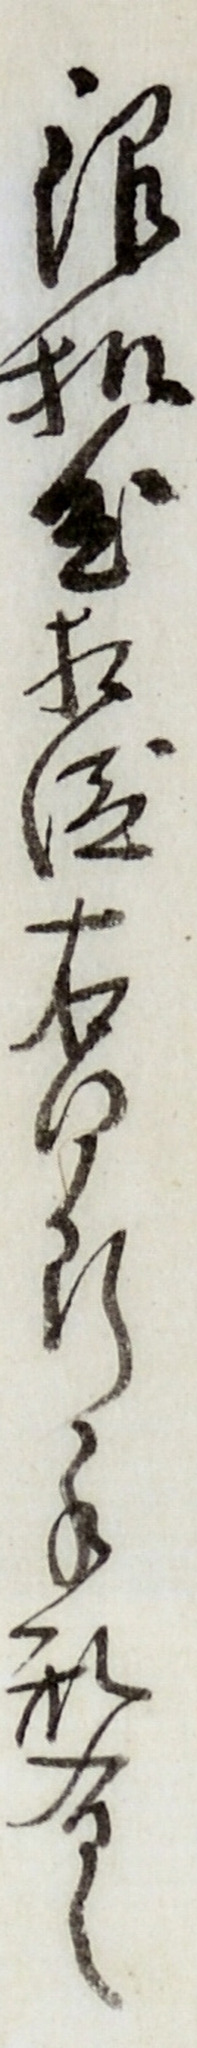銀拾匁相渡右同断手形有之
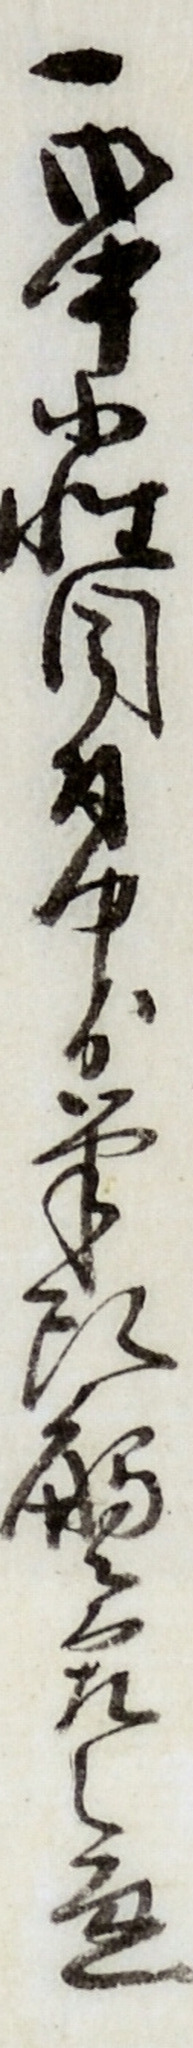一御中小性目付中ゟ筆頭触ニ而左之通
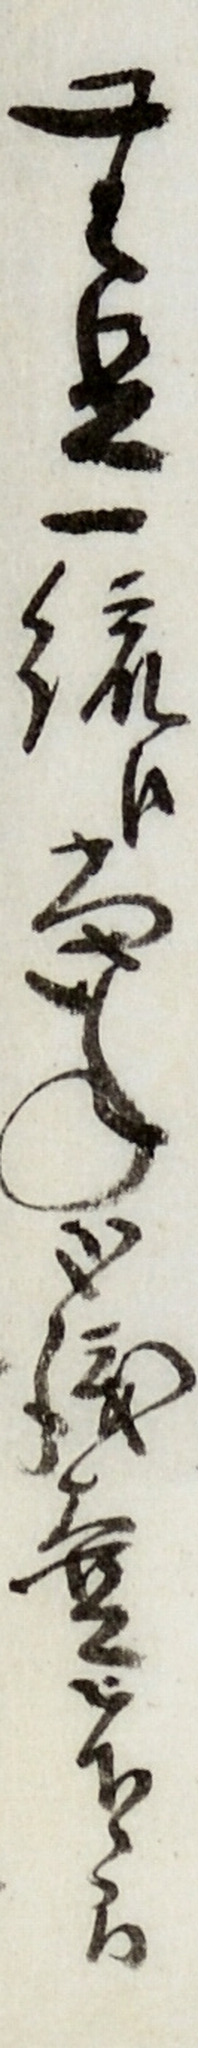無足一統江当年御残被下候間
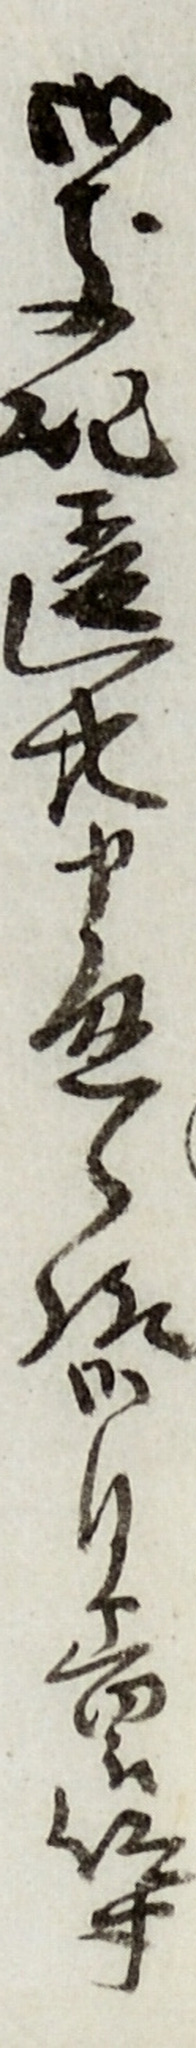御支配違共申通候様御月番被仰付
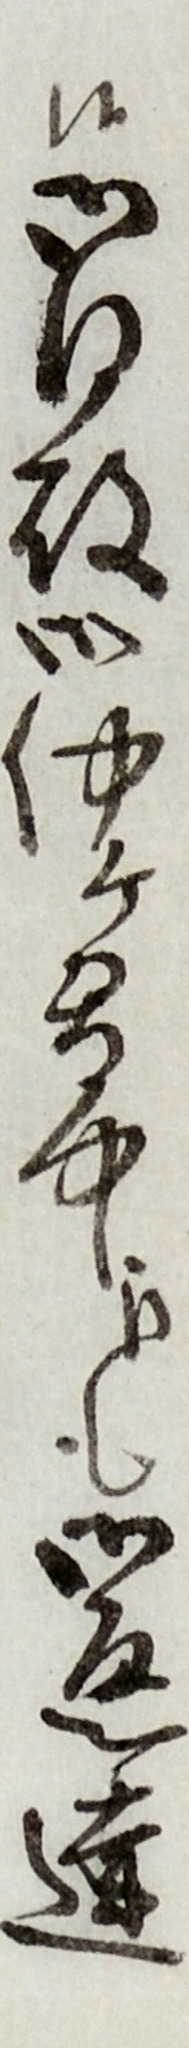候御同役御仲ケ間中江も御通達
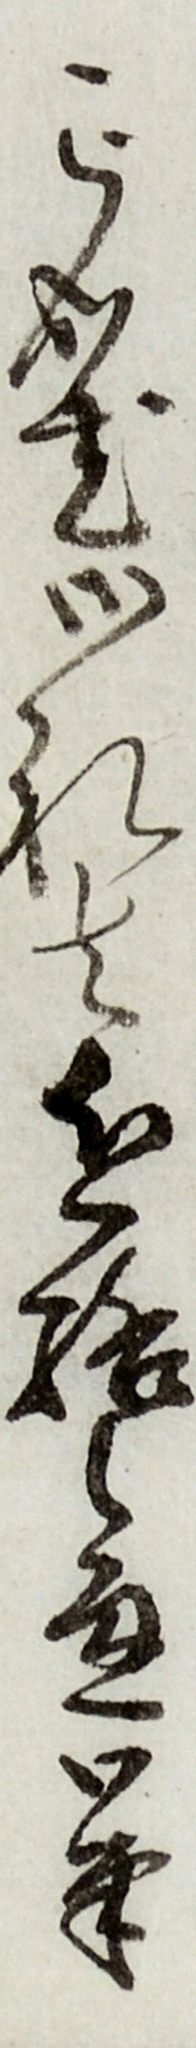可被成尤御礼者近格之通御筆
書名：御山方御薪方諸事御用留
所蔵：伊那市立高遠町図書館・合同会社AMANE
